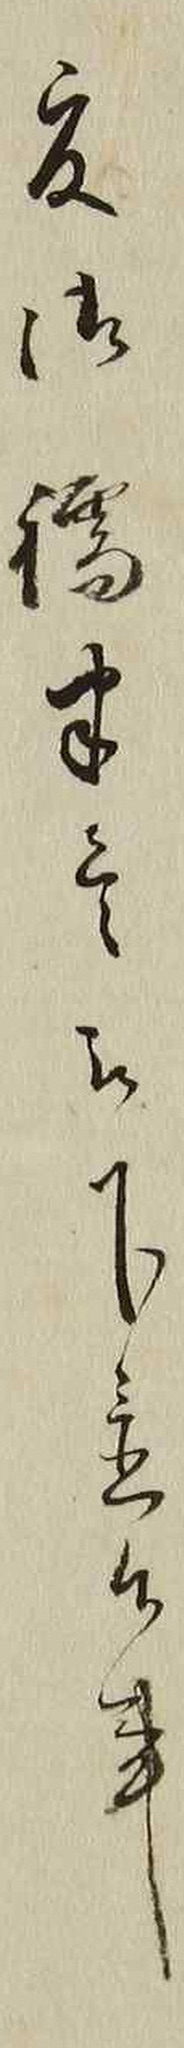夏御襦半壱被下置候事
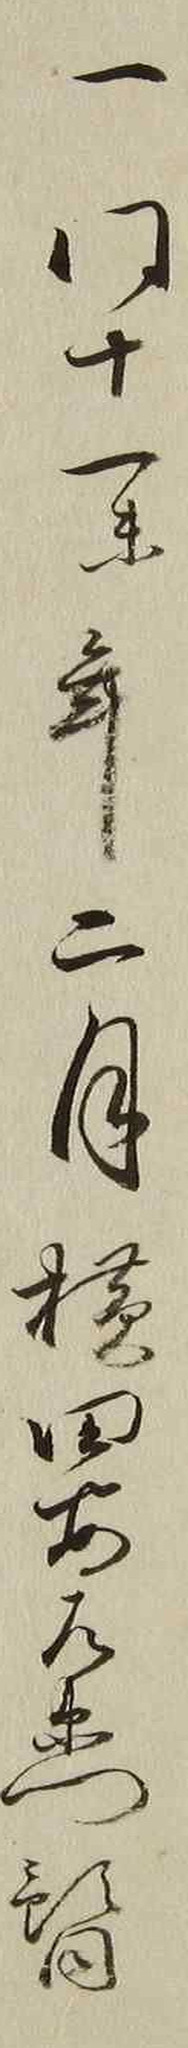一同十一未年二月横田安左衛門預同
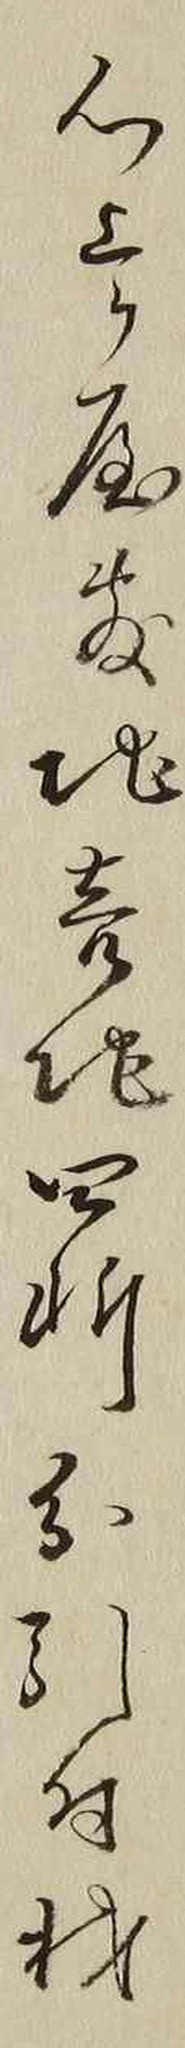心上ヶ屋敷地売地四所分引付材
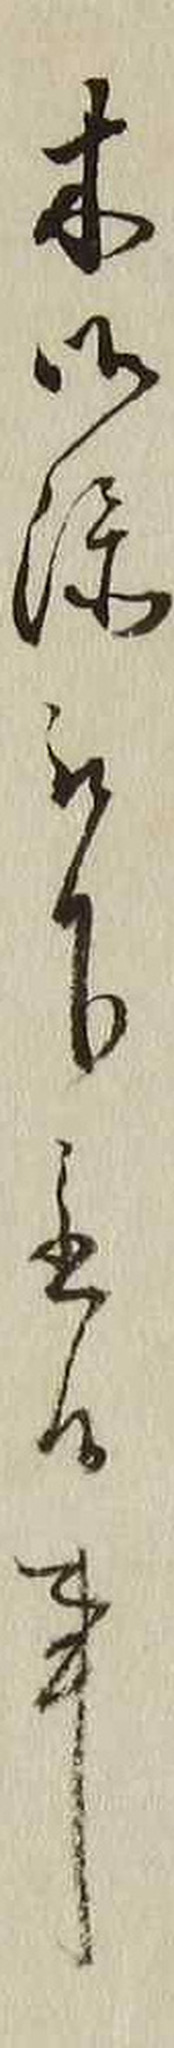木御添被下置候事
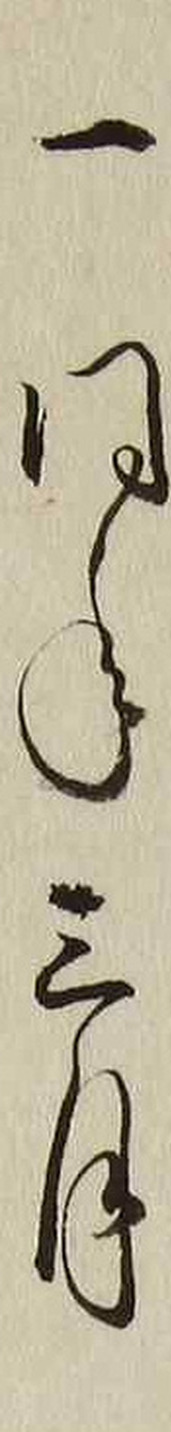一同年三月
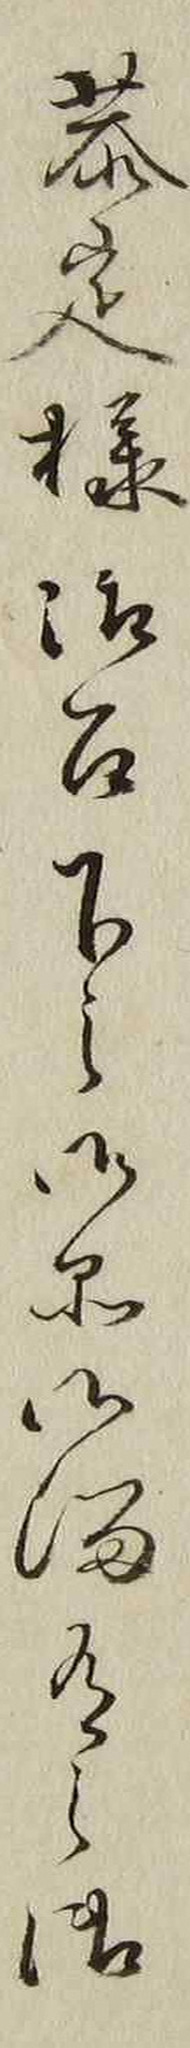恭定様御召下之御品御酒有之御
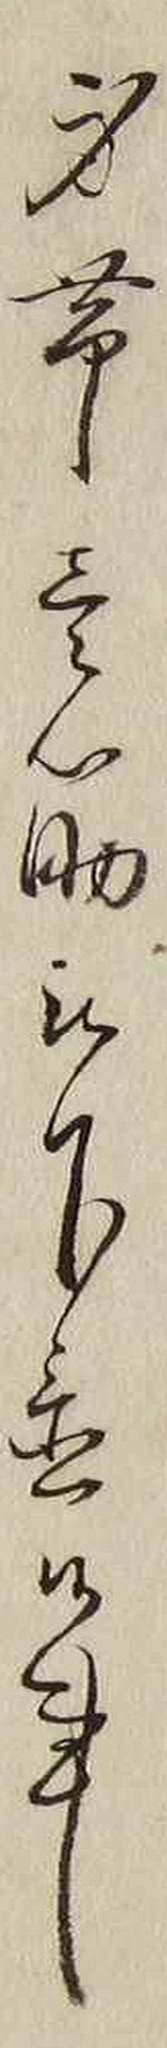身帯壱筋被下置候事
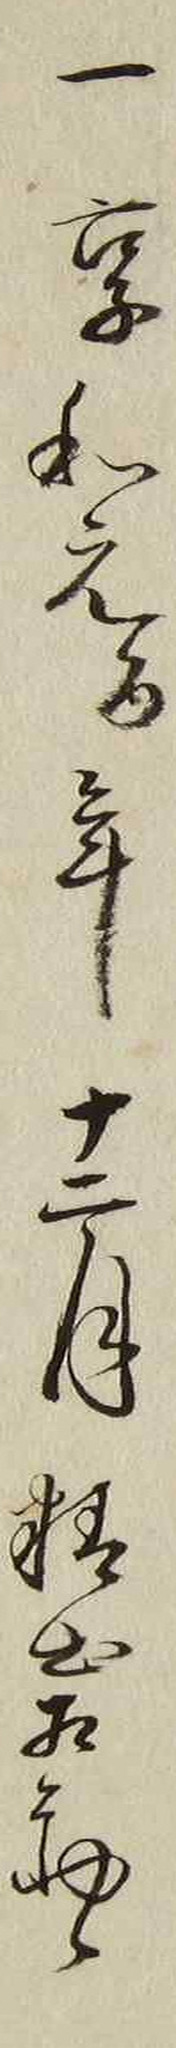一享和元酉年十二月精出相勤候
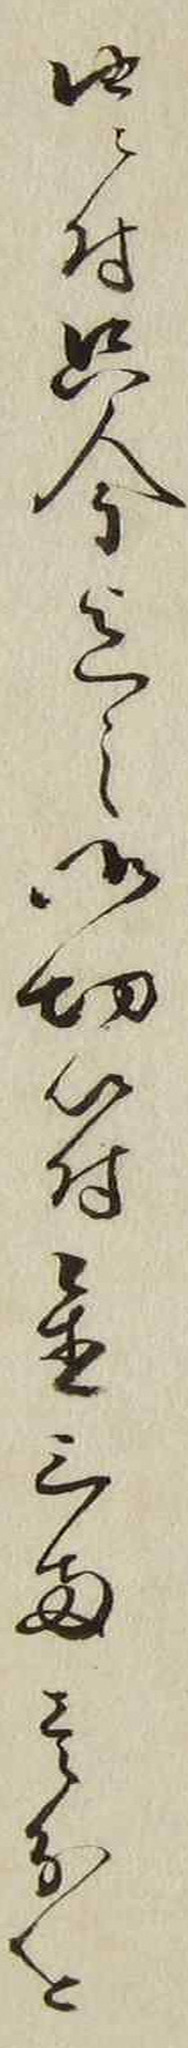由付只今迄之御切符金三壱分を
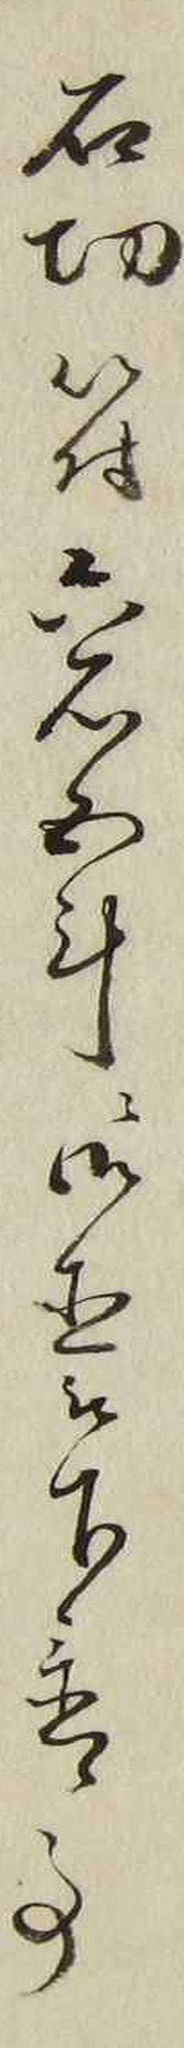石切符六石五斗ニ御直被下置候事

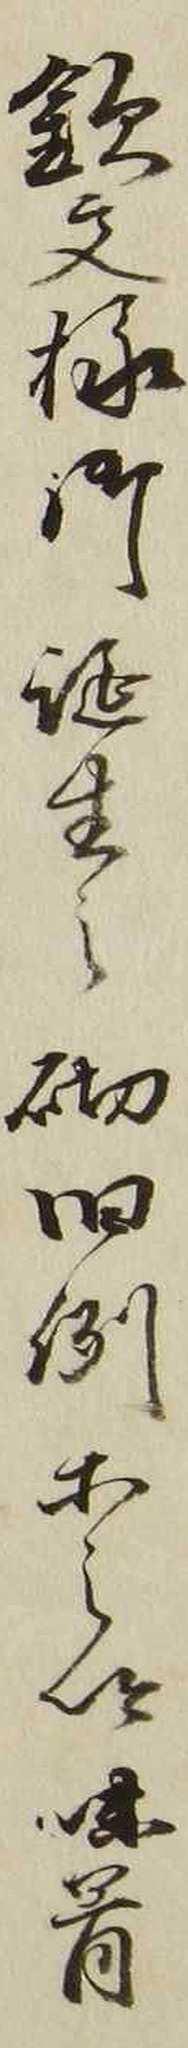欽文様御誕生之砌旧例等之吟味骨
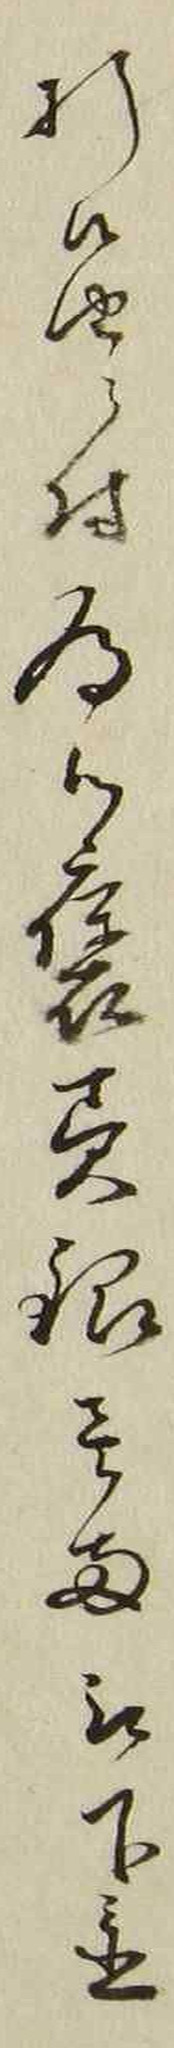折候由付為御褒美銀壱両被下置
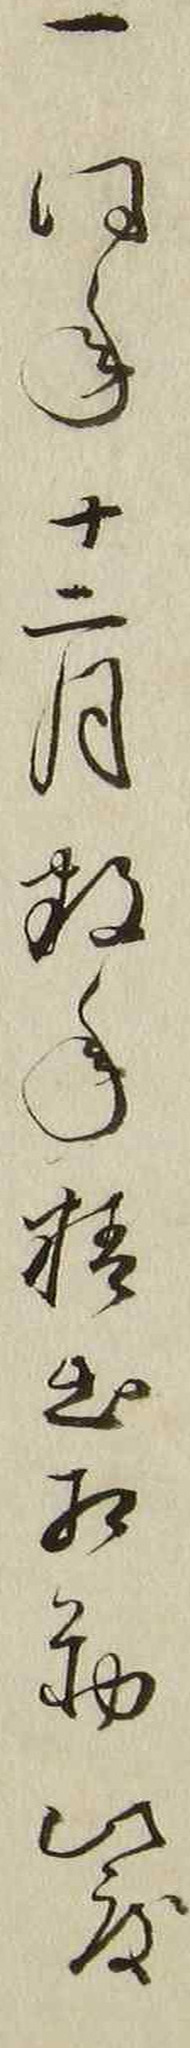一同年十二月数年精出相勤此度
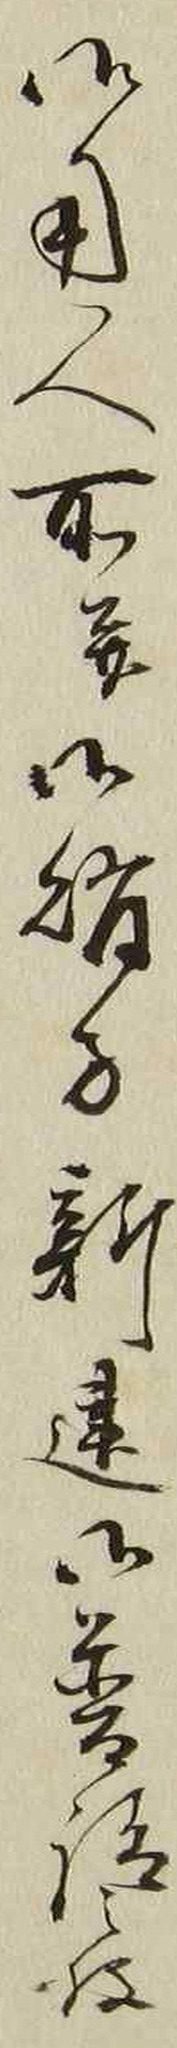御用人所幷御賄方新建御普請之儀
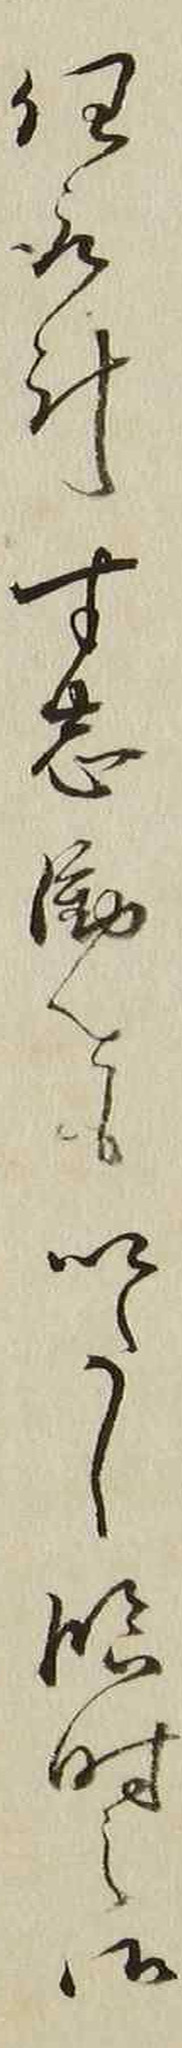任取計寸志働をもいたし臨時之御
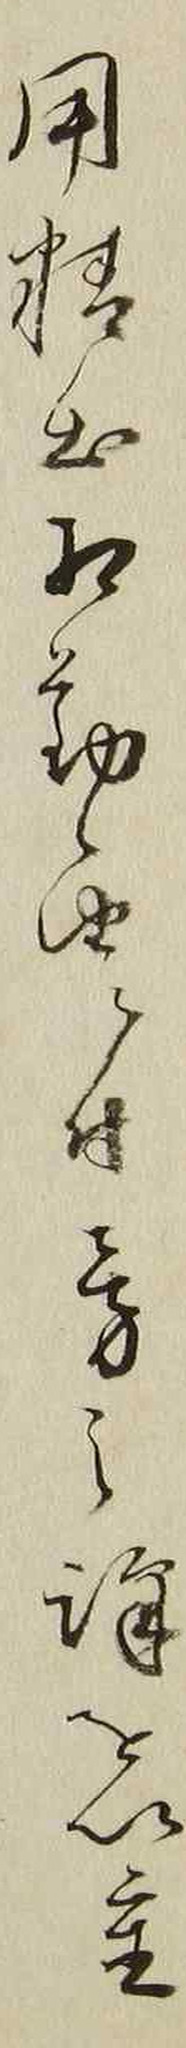用精出相勤候由付旁之訳を以金
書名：諸士系譜　巻之10　い之部10
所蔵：会津若松市立会津図書館
